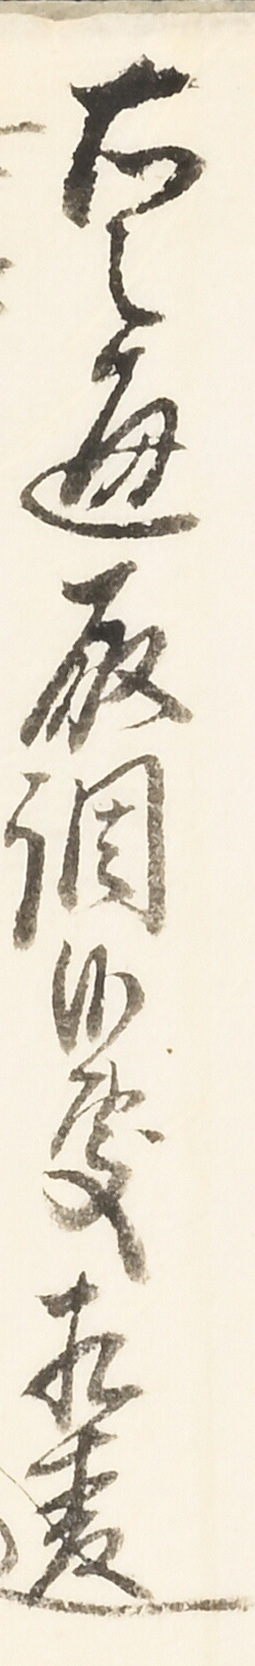右之通取調候処相違
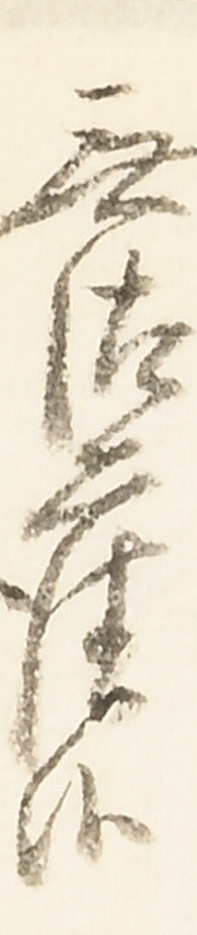無御座候
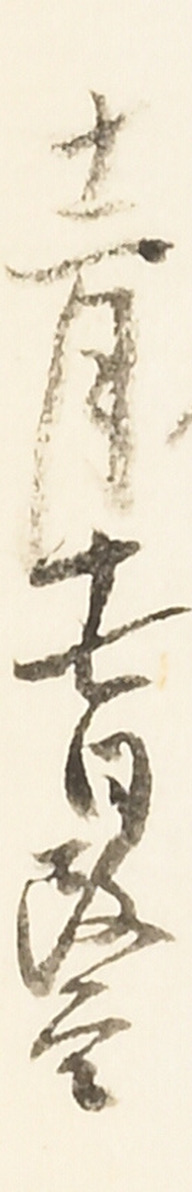十二月十七日改定
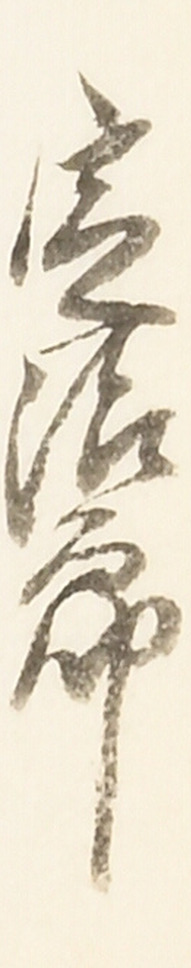定治郎
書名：天保十三壬寅年十二月十七日家財諸道具石数石切道具取調帳
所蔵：伊那市立高遠町図書館・合同会社AMANE
